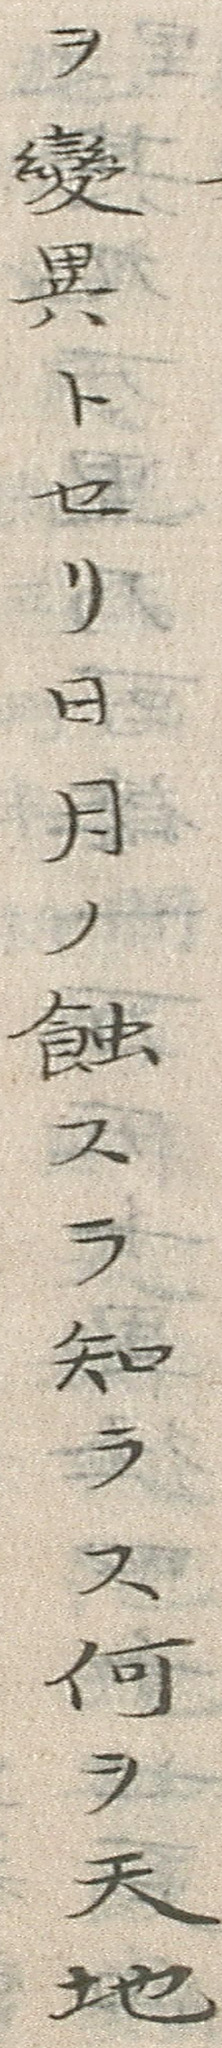ヲ変異トセリ日月ノ蝕スラ知ラス何ヲ天地
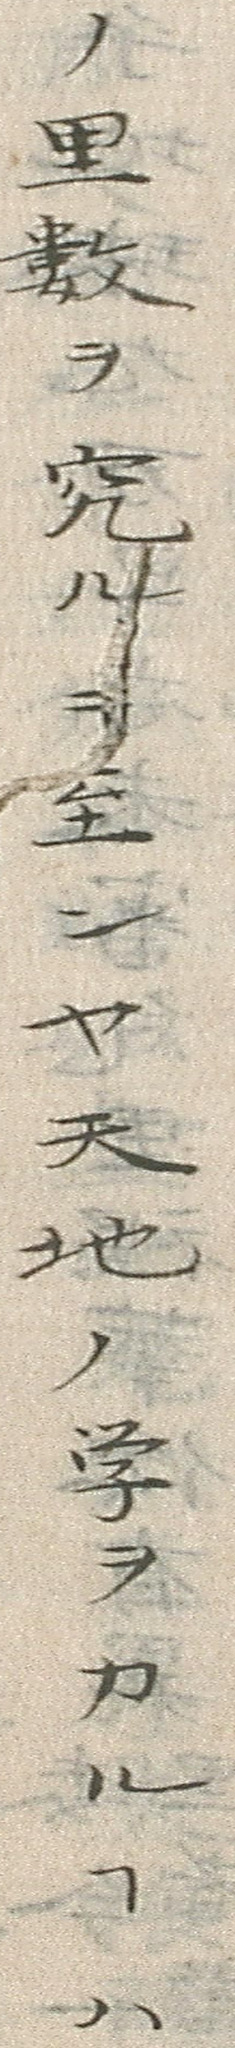ノ里数ヲ究ルヲ至ンヤ天地ノ学ヲカルコトハ
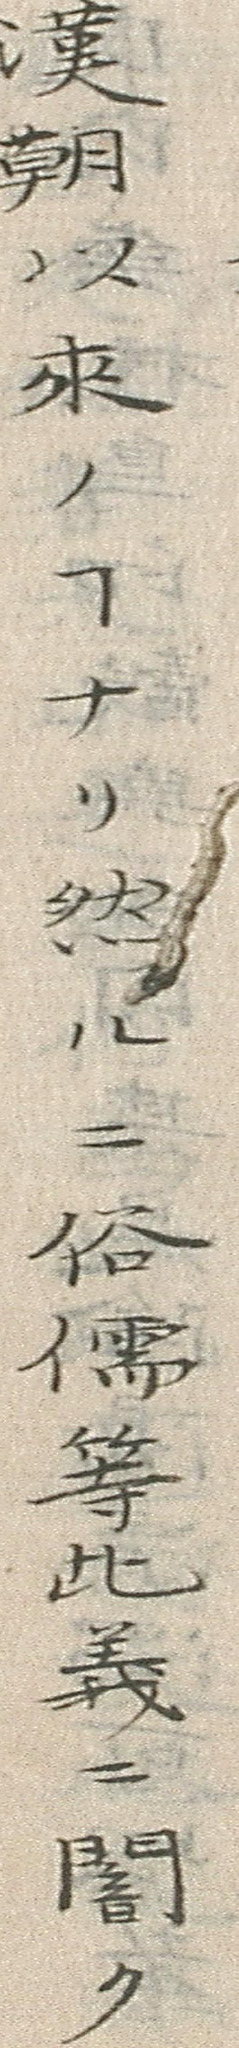漢朝以来ノコトナリ然ルニ俗儒等此義ニ闇ク
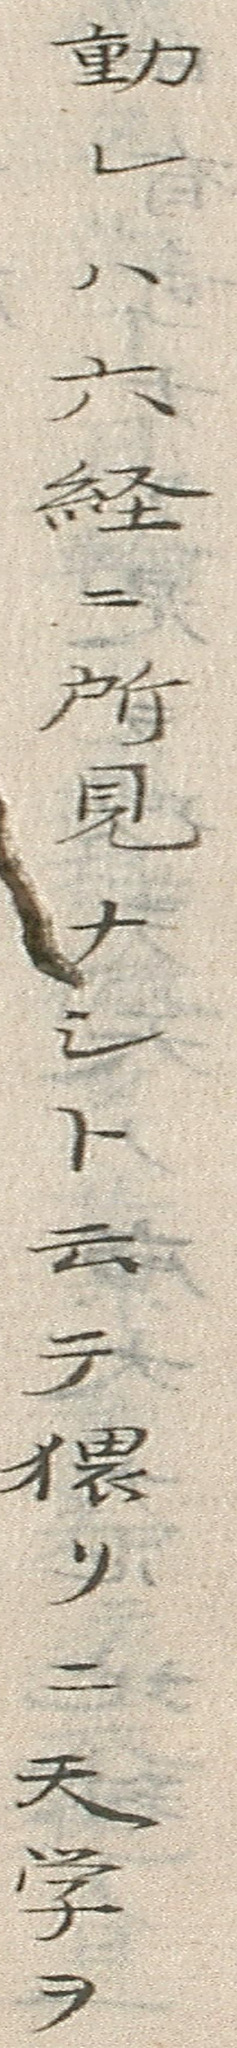動レハ六経ニ所見ナシト云テ猥リニ天学ヲ
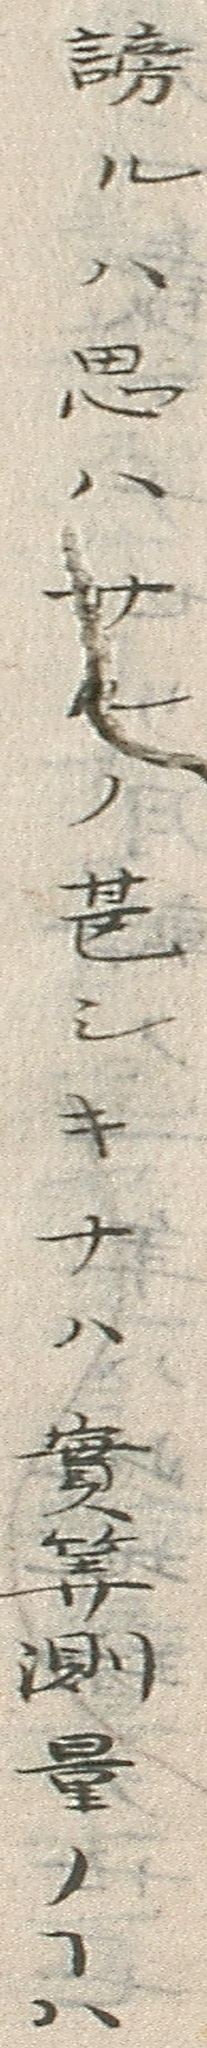謗ルハ思ハサルノ甚シキナハ実算測量ノコトハ
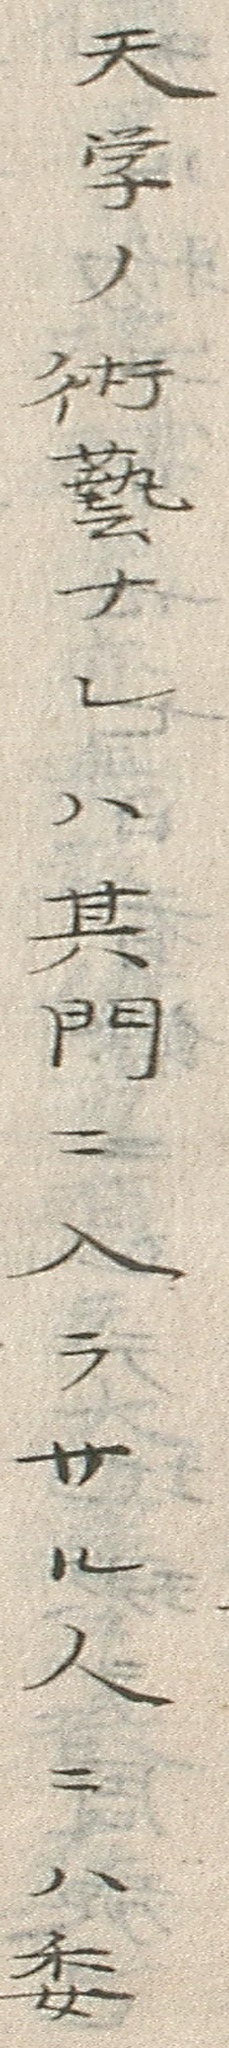天学ノ術芸ナレハ其門ニ入ラサル人ニハ委
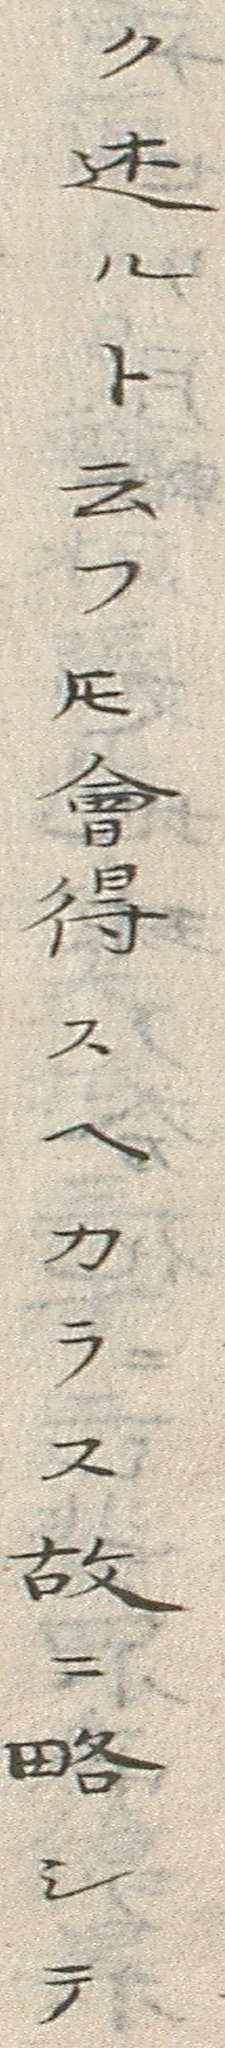ク述ルト云フトモ会得スヘカラス故ニ略シテ
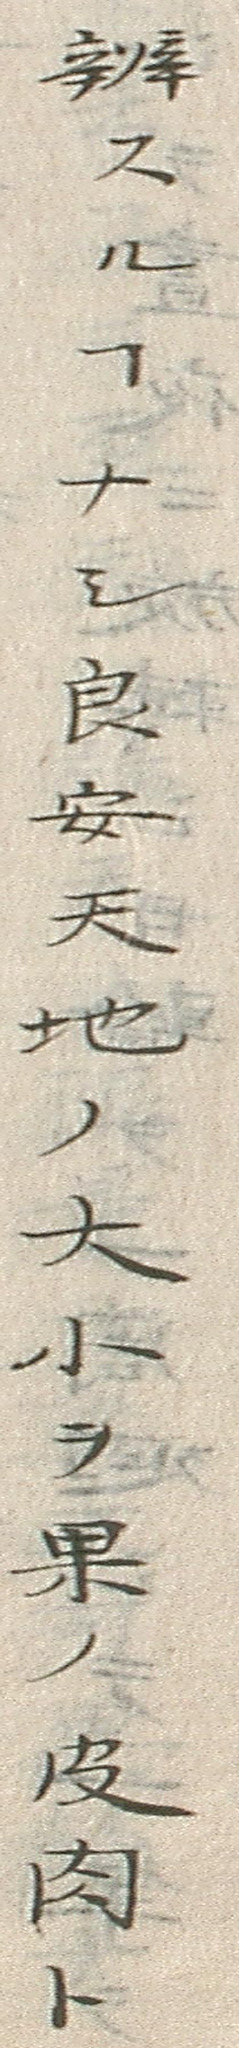弁スルコトナシ良安天地ノ大小ヲ果ノ皮肉ト
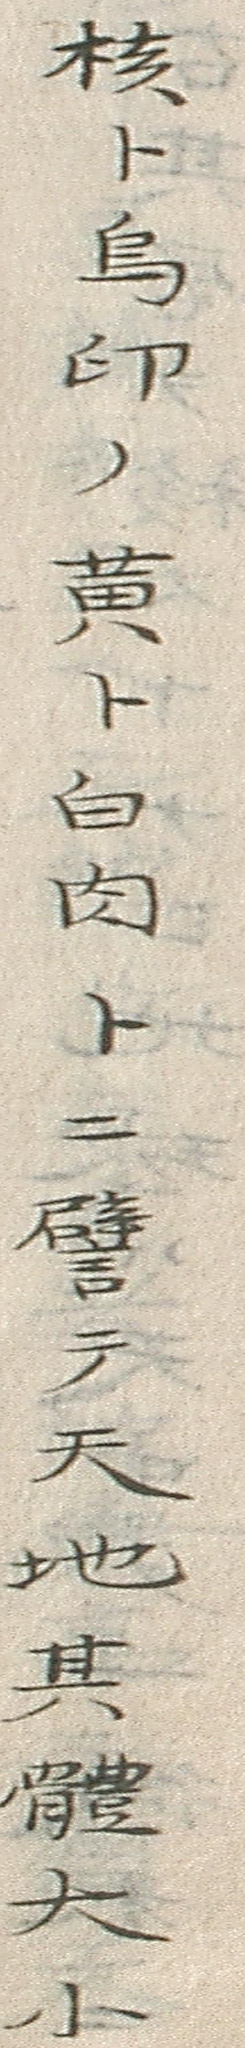核ト鳥印ノ黄ト白肉トニ譬テ天地其体大小
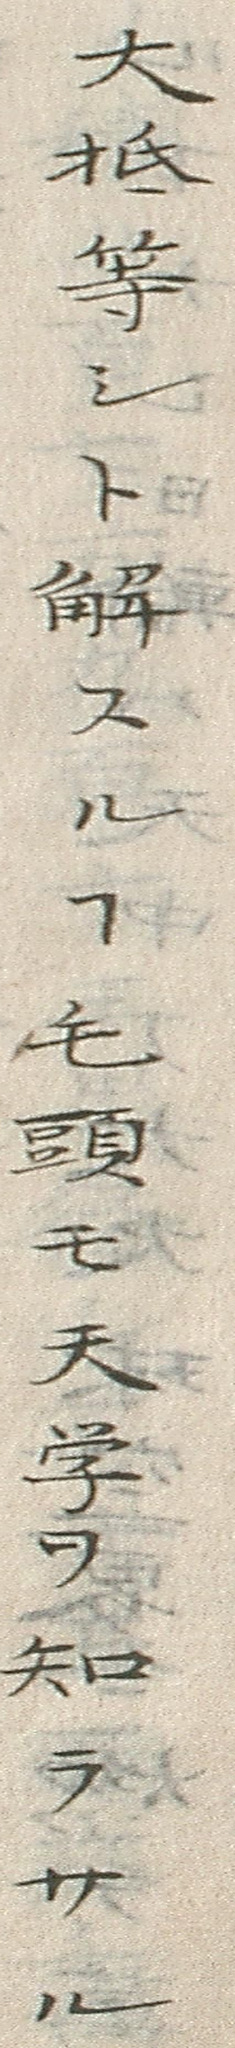大抵等シト解スルコト毛頭モ天学ヲ知ラサル
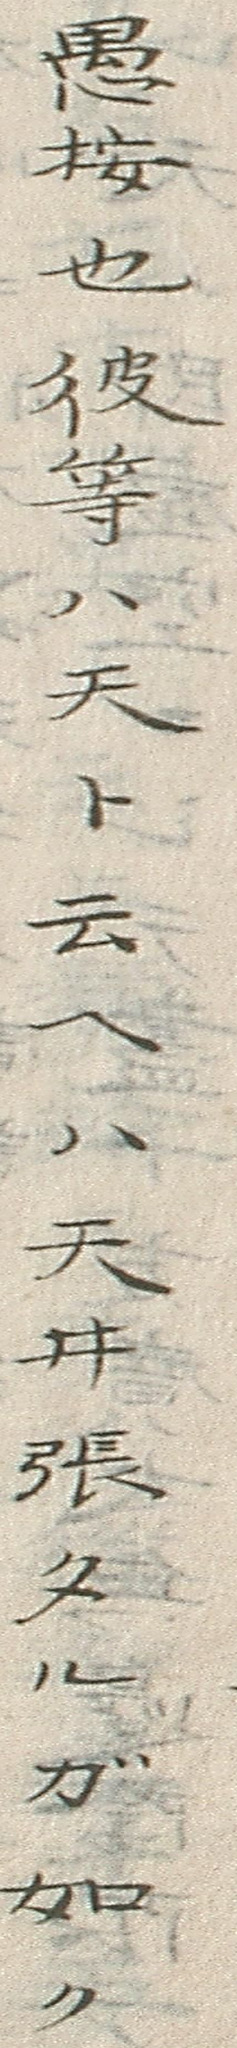愚按也彼等ハ天ト云ヘハ天井張タルガ如ク
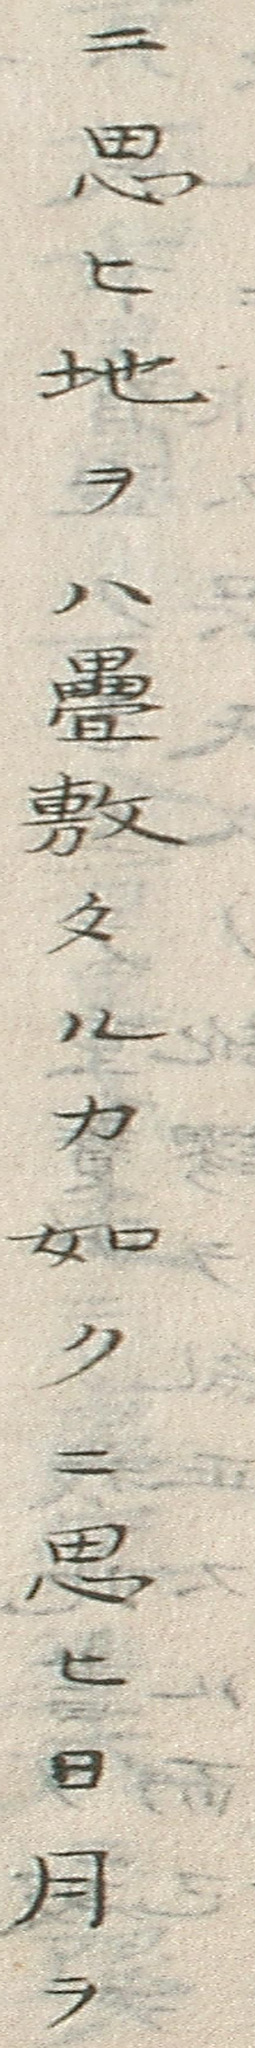ニ思ヒ地ヲハ畳敷タルカ如クニ思ヒ日月ヲ
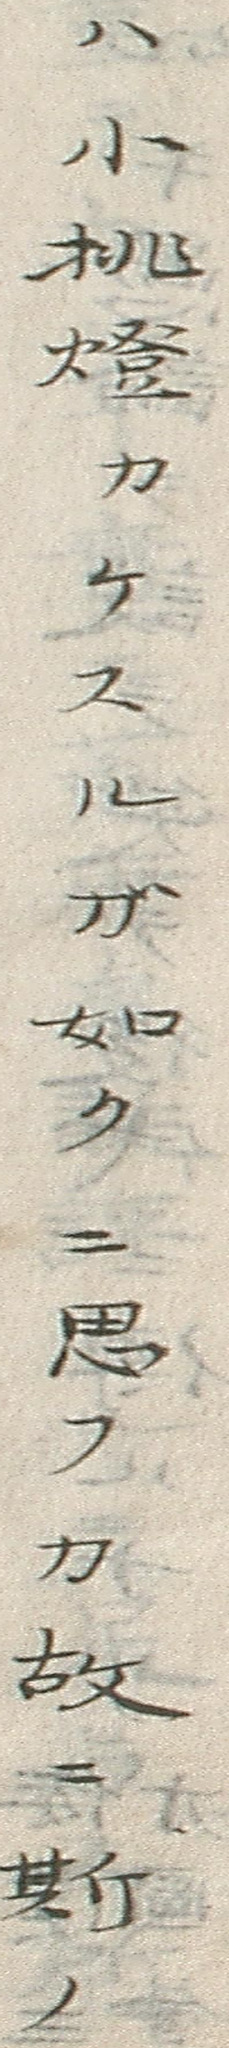ハ小排燈カケスルガ如クニ思フカ故ニ斯ノ

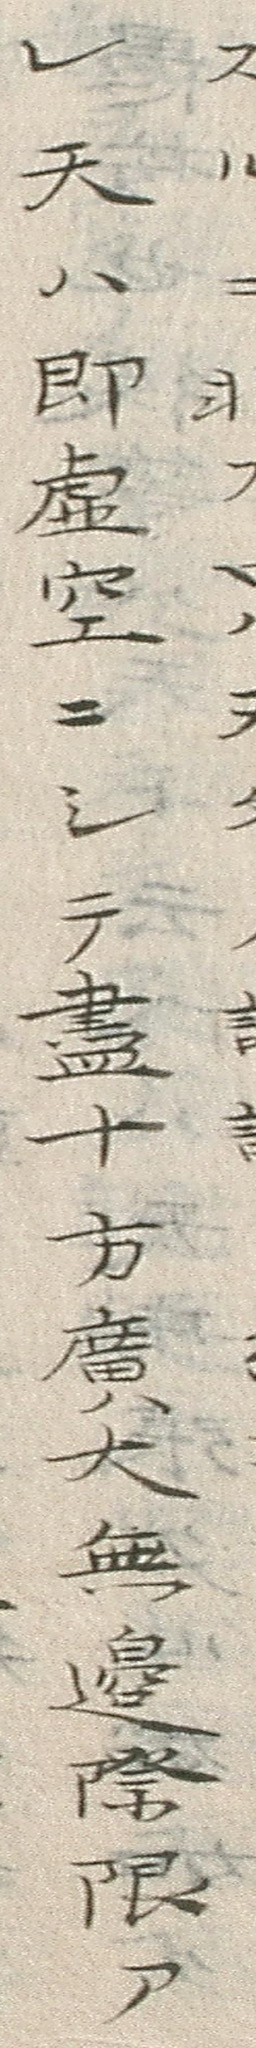レ天ハ即虚空ニシテ尽十万広大無辺際限ア
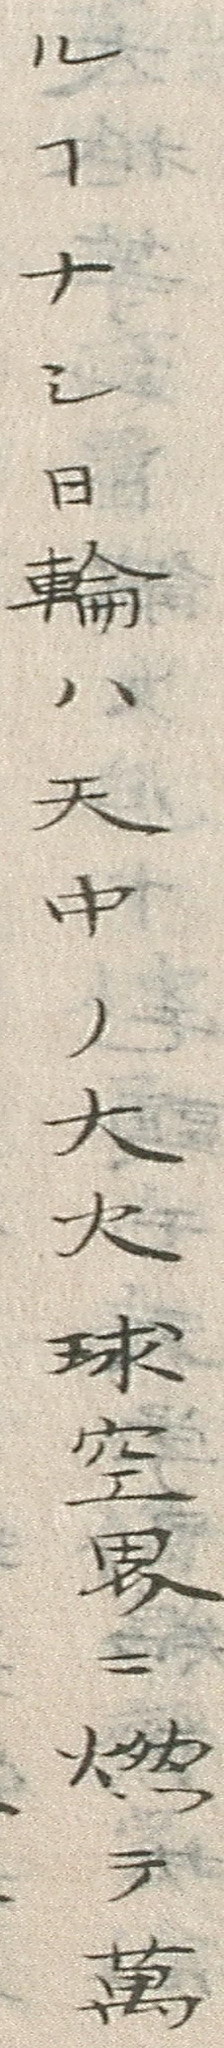ルコトナシ日輪ハ天中ノ大火球空界ニ燃テ万
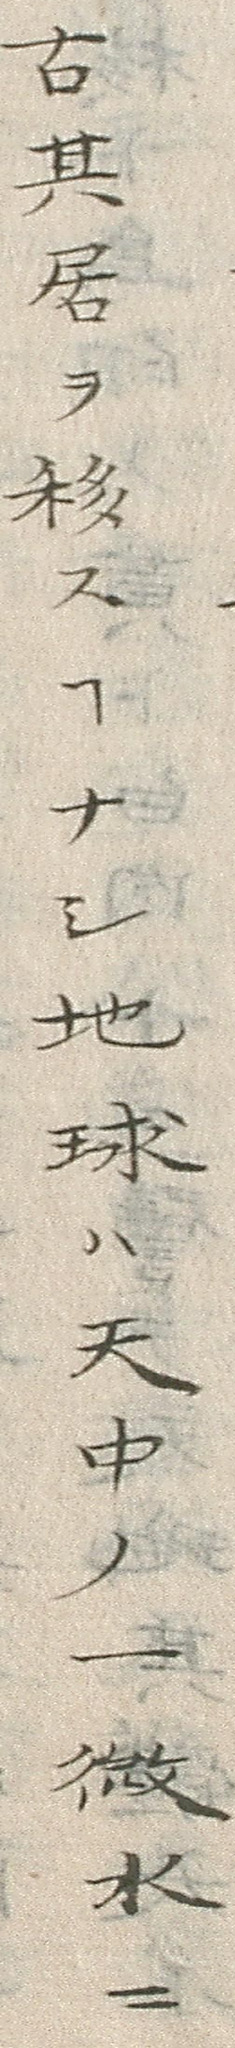古其居ヲ移スコトナシ地球ハ天中ノ一微水ニ
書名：天學略名目羽翼　全
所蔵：東京大学地震研究所図書室 Earthquake Research Institute Library, The University of Tokyo, JAPAN
